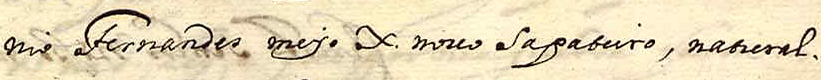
nio Fernandes meyo X. nouo sapateiro, natural,
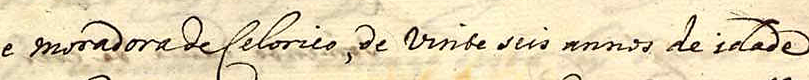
e moradora de Celorico, de vinte seis annos de idade.
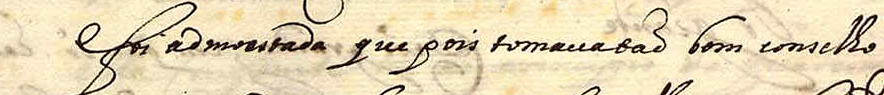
e foi admoestada que pois tomaua taõ bom conselho
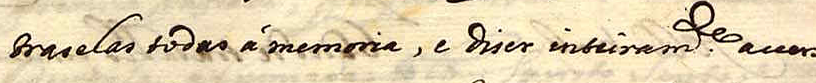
traselas todas á memoria, e diser inteiram.te a uer
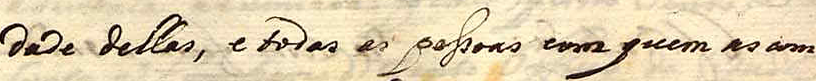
dade dellas, e todas as pessoas com quem as com
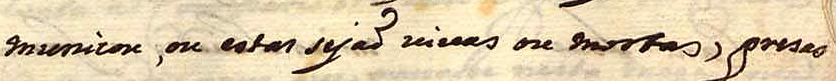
municou, ou estas sejaõ uiuas ou mortas, presas
